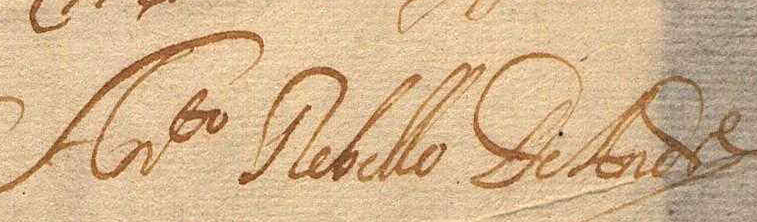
Anto Rebello De Andre
